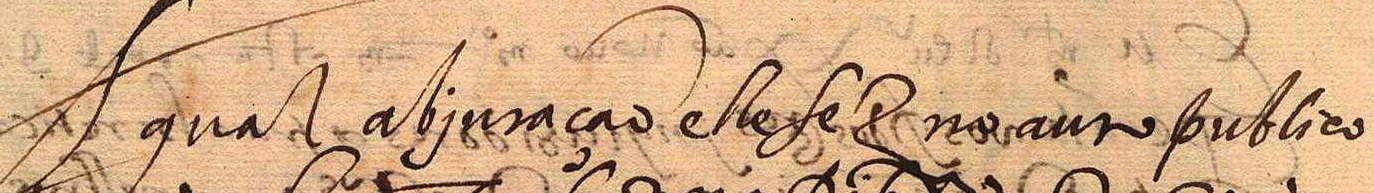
A qual abjuraçaõ elle fez no auto publico
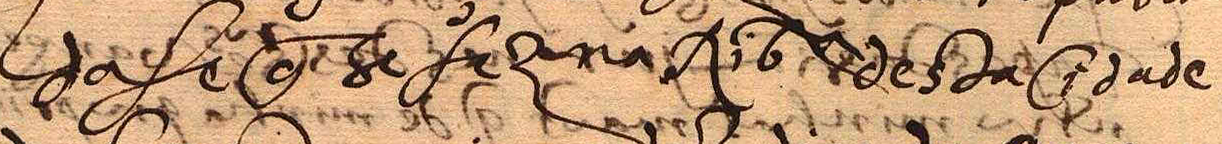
da fe q̄ se fez na Ribra desta Cidade
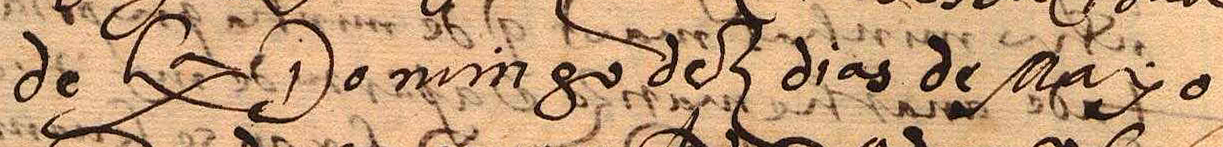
de Lxa Domingo dez dias de Mayo
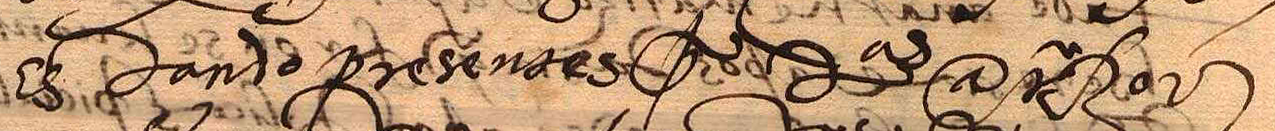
Estando presentes p̄o tas āto Roiz̄
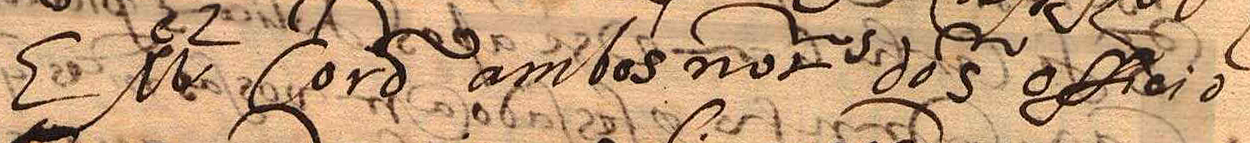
E Mel Cordro ambos notros do sto officio
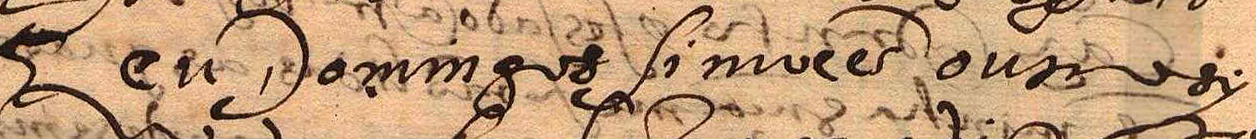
E eu Domingos Simoeẽs outrosy
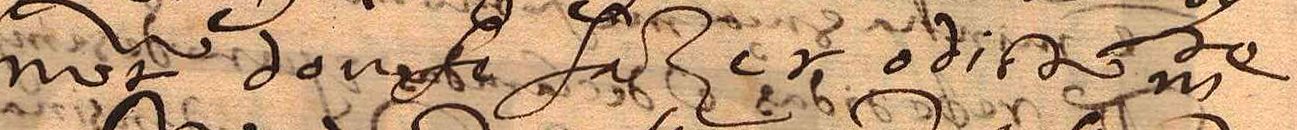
notro dou fe fazer o dicto mte
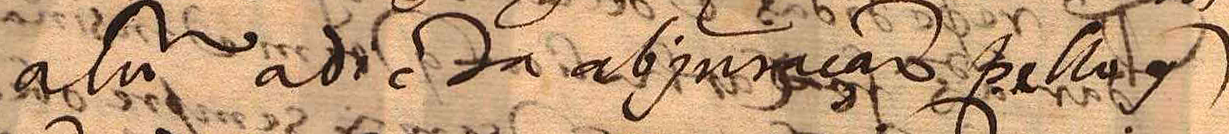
aluro a dicta abjuração pello q̄
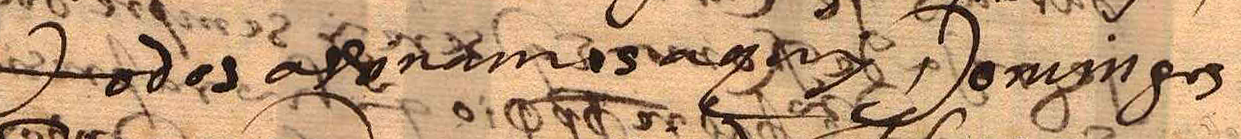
todos assinamos aquy Domingos
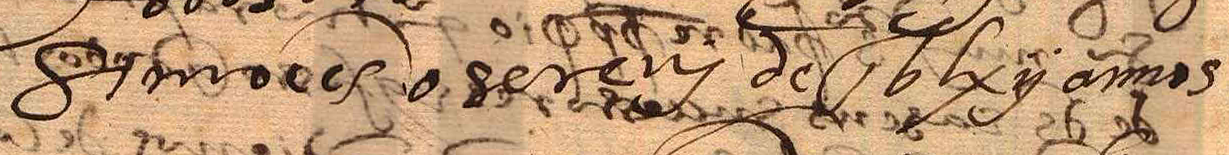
Simoeẽs o screuj de j̄ b lxij annos
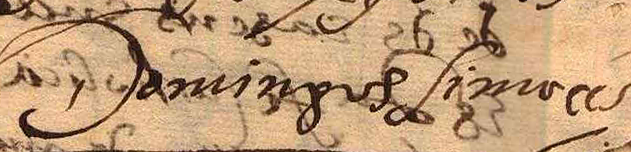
Domingos Simoees
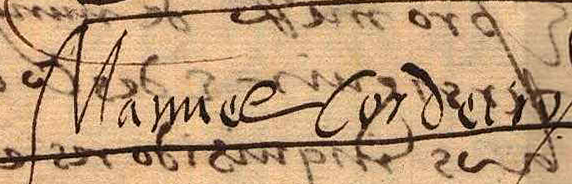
Manuel Cordeiro
